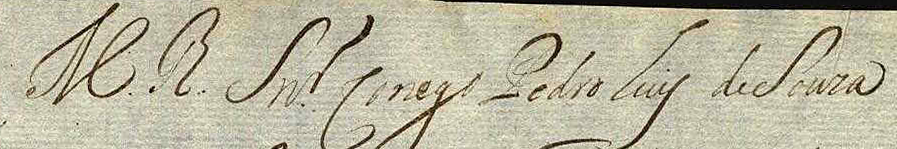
M. R. Sn.r Conego Pedro Luis de Souza
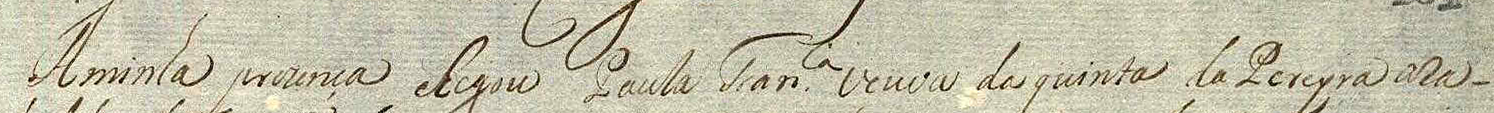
À minha prezença chegou Paula Fran.ca veuva da quinta da Pereyra aRa
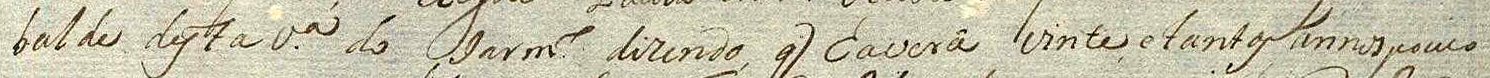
balde desta V.a do Iarm.o dizendo, q̄ haverá vinte, e tantos annos pouco
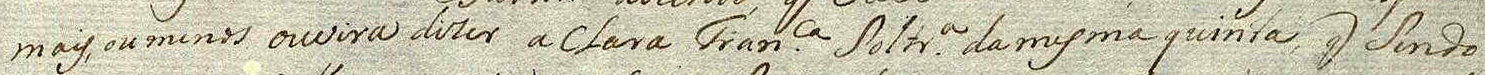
mais, ou menos ouvira dizer a Clara Fran.ca Soltr.a da mesma quinta, q̄ Sendo
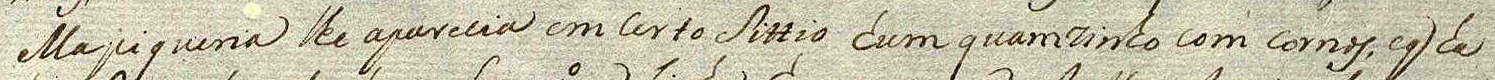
ella piquena lhe aparecia em certo Sittio hum quamzinho com cornos, e q̄ ha
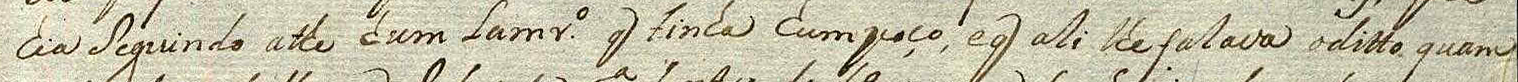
hia seguindo athe hum Lamr.o q̄ tinha hum poço, e q̄ ali lhe falava o ditto quam
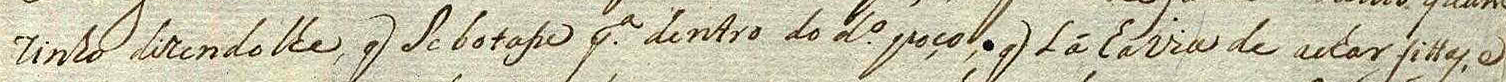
zinho dizendo lhe, q̄ Se botasse p.a dentro do d.o poço, q̄ Lá havia de achar fittas, e
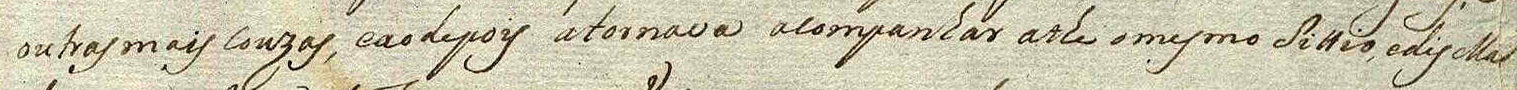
outras mais couzas, e ao depois a tornava acompanhar athe o mesmo Sittio, e dis ella
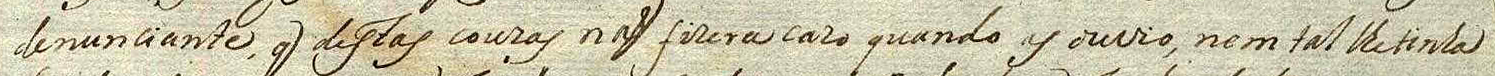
denunciante, q̄ destas couzas naõ fizera cazo quando as ouvio, nem tal lhe tinha
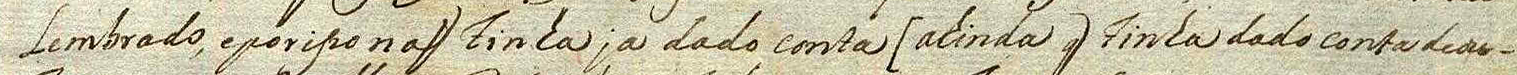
Lembrado, e por isso naõ tinha ja dado conta [ahinda q̄ tinha dado conta de ou
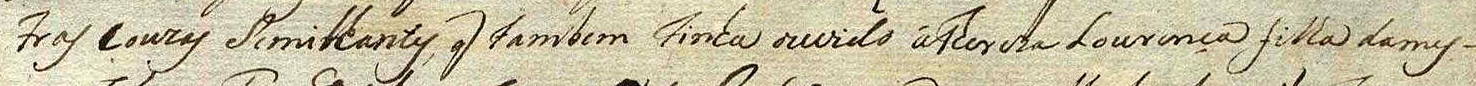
tras couzas Semilhantes, q̄ tambem tinha ouvido á Thereza Lourença filha da mes
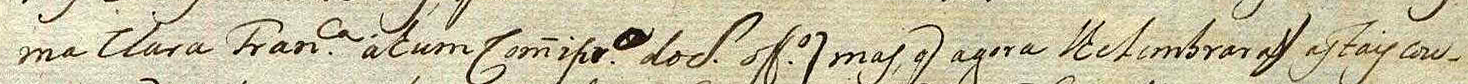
ma Clara Fran.ca a hum Com̄isr.o do S. off.o] mas, q̄ agora lhe lembraraõ as tais cou
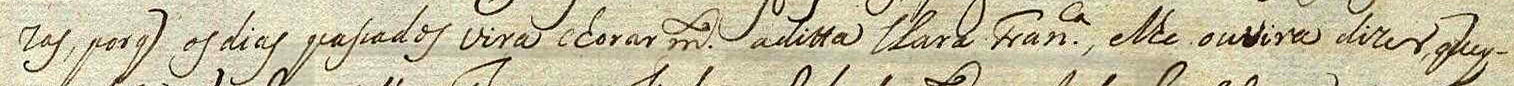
zas, porq̄ os dias passados vira chorar m.to a ditta Clara Fran.ca, e lhe ouvira dizer, quey
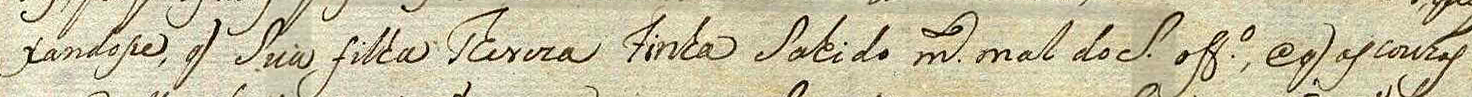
xandosse, q̄ Sua filha Thereza tinha Sahido m.to mal do S. off.o, e q̄ as couzas
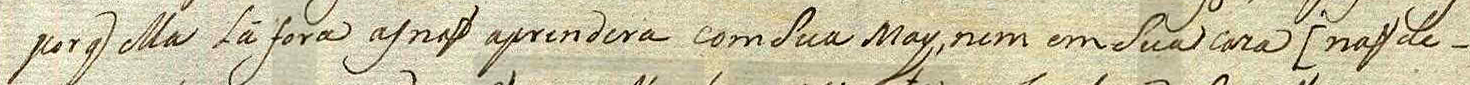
por q̄ ella Lá fora as naõ aprendera com Sua May, nem em Sua caza [naõ de
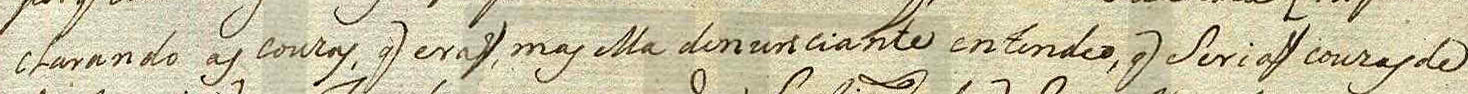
clarando as couzas, q̄ eraõ, mas ella denunciante entendeo, q̄ Seriaõ couzas de
